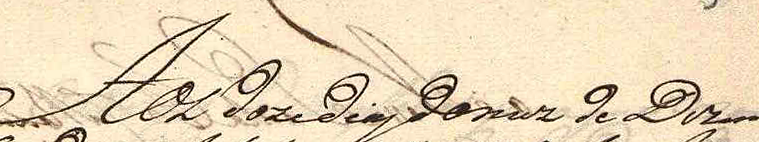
Aoz doze dias do mez de Dezem
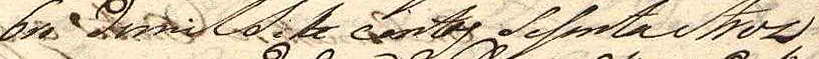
bro de mil Setecentos Sesenta e trez
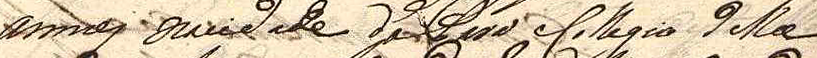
annos na cidade do Para e Collegio della
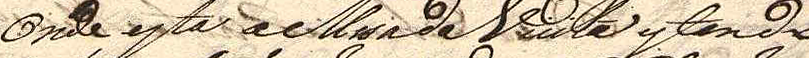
onde esta a Mesa de Visita estando
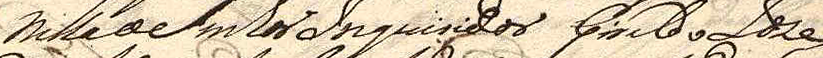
nella o Senhor Inquisidor Giraldo Ioze
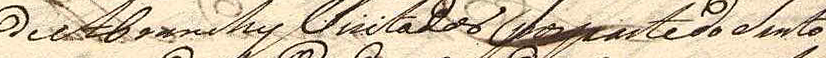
de Abranches Vizitador por parte do Santo
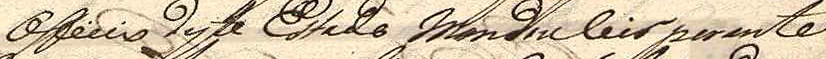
Officio deste Estado mandou uir perante
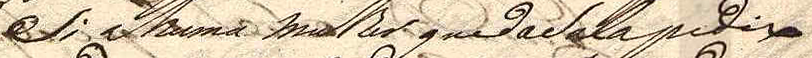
Si a huma mulher que da Sala pedia
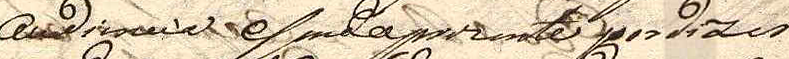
audiencia e sendo prezente por dizer
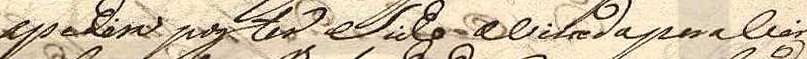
a pedira por ter Sido auizada para uir
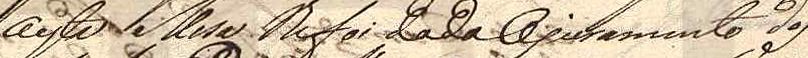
a esta Mesa lhe foi dado O juramento dos
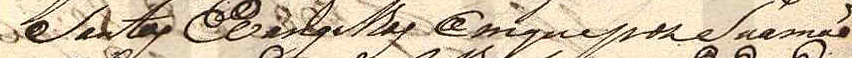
Santos Evangelhos Em que poz Sua maõ
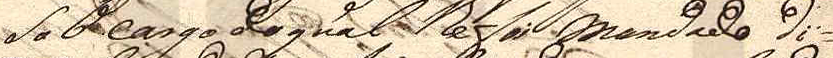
Sob cargo do qual lhe foi mandado di
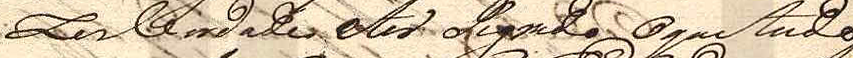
Zer Uerdade e ter Segredo o que tudo
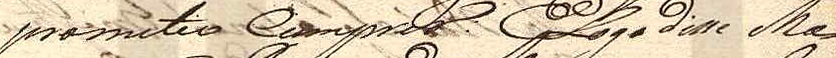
prometeo Cumprir E Logo disse cha
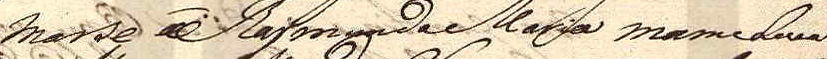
marse Raymunda Maria mameLuca
